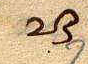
23
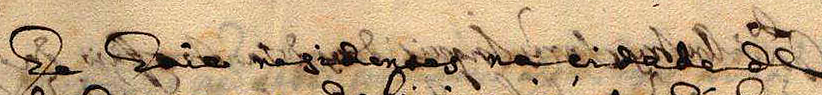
he hoie residentes na cidade de
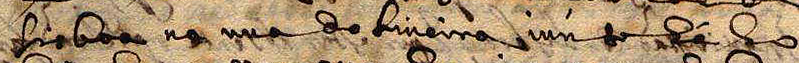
lisboa na rua doliueira iunto háho
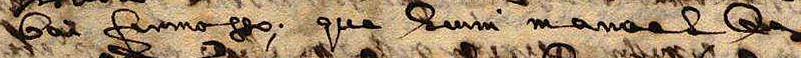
boi fermosso; que hum manoel ber
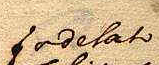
q̄ o delato
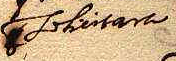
q̄ solicitara
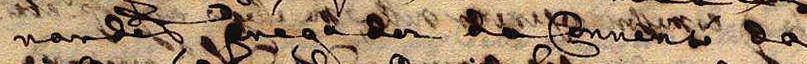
nardes, pregador do Conuento da
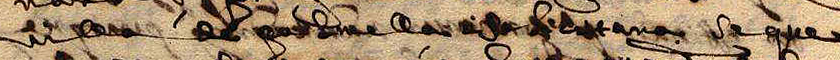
uilla de palmella solicitara se que
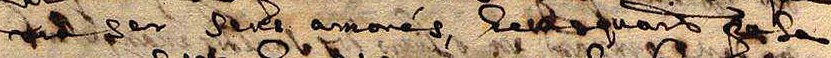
ria ser seus amores, has quais pala
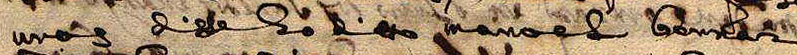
uras disse ho ditto manoel bernar
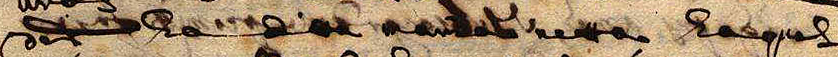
des ha dita maria netta, ha qual
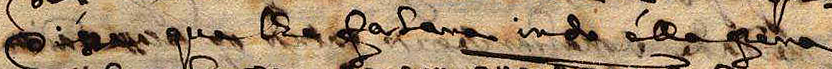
disse que lhe falara indo ella pera
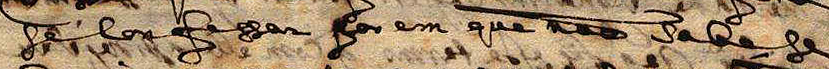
se confessar porem que naõ sabe se
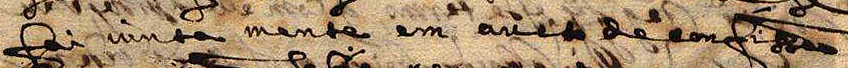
foi iuntamente em aucto de confissaõ
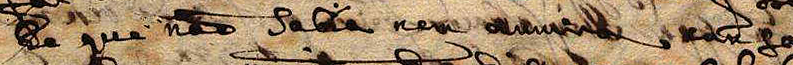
he que não sabia nem ouuira cousa
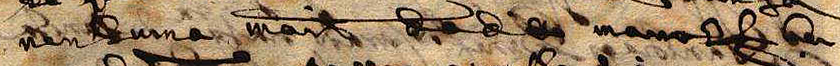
nenhuma mais do ditto manoel ber
